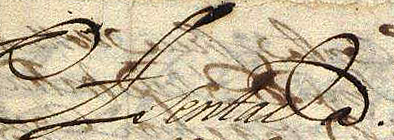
Asentada.
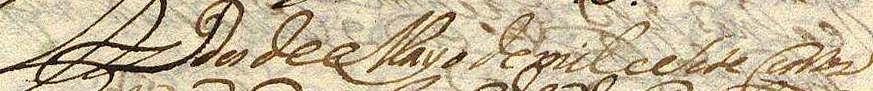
Aos des de Mayo de mil e SeteCentos
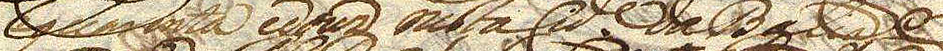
e quarenta e douz nesta Cid.e da Bahia e
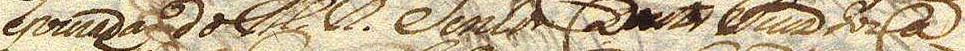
e pouzada do M. R. Senhor Doutor Iuiz doz Ca
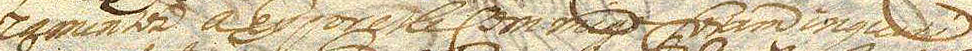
zamentoz ahy por elle Commigo foram inquiri
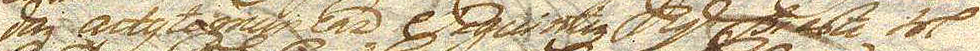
das as testemunhaz Seguintes de q̄ fis este ter.o
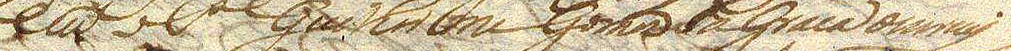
e eu o Pe Guilherme Gomez da Graça o escreuj
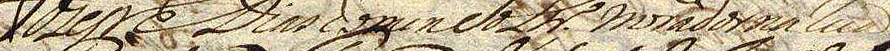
Jozeph Dias homen Soltr.o morador na Rua
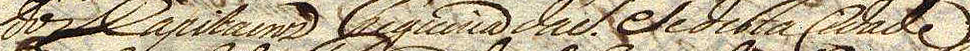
dos Capitaenz Freguesia da S. Se desta Cidade
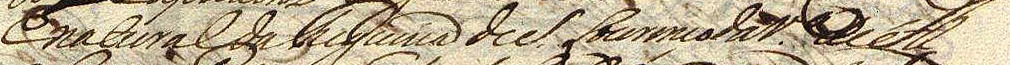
e natural da Freguesia de S. Lourenço da V.a de Al
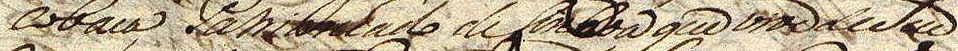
cobaca, Patriarchado de Lisboa, que vive de Seu
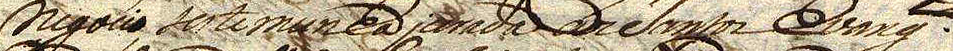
negocio, testemunha jurada aoz Santoz Evangoz.
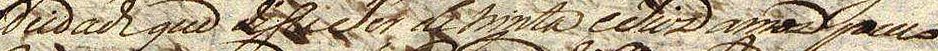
de idade que disse Ser de trinta e Seiz annoz pouco
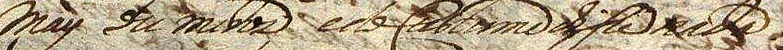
mais ou menoz, e do Costume disse nada
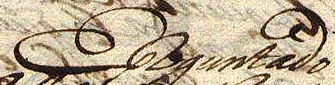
E proguntado
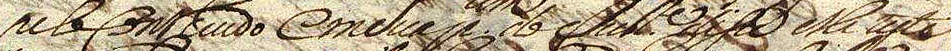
pelo Contheudo em sua p.am do Iust.e disse elle teste
